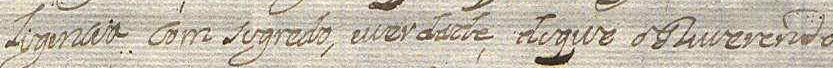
ligencia com segredo, e uerdade, de que o Reuerendo
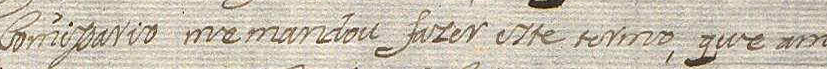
Com̄issario me mandou fazer este termo que am
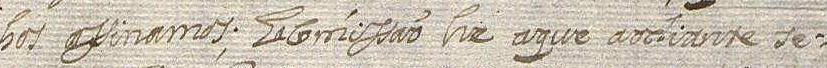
bos assinamos; E a com̄issaõ he a que ao diante se
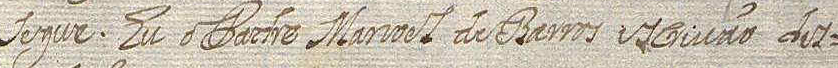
segue. Eu o Padre Manoel de Barros escriuaõ des
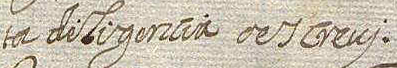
ta diligencia o escreuj.
